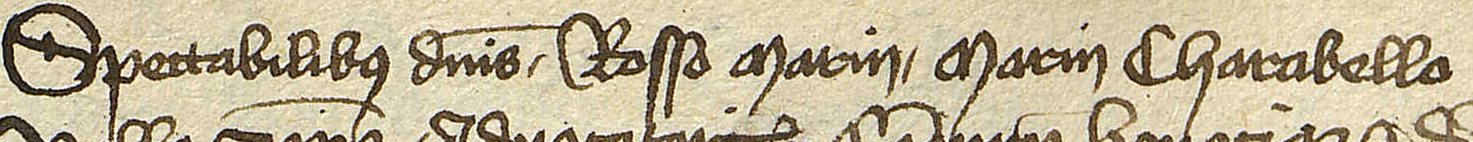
Spectabilib* d*nis Roſſo Marin / Marin Charabello
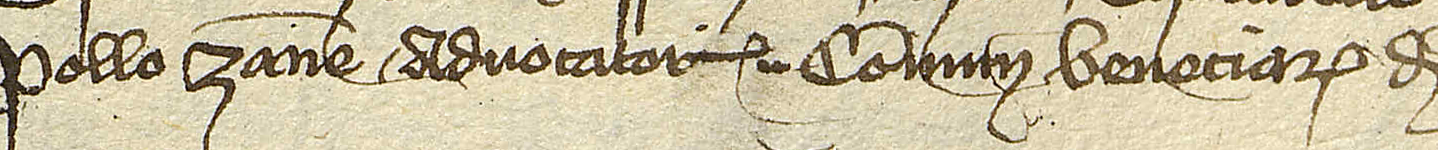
Pollo Ʒan*e / Aduocator* ~ Co*m*n* Venetia* d*
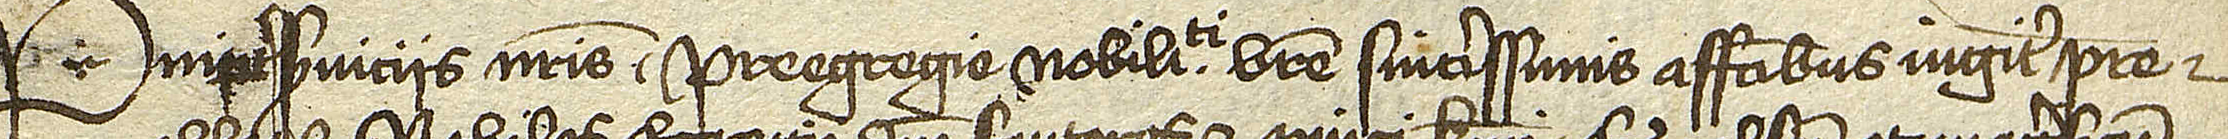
P*mpt* ſ*uiciis n*ris / Preegregie nobili*ti v*re ſinc*iſſimis aff*tibus iugit* pre =
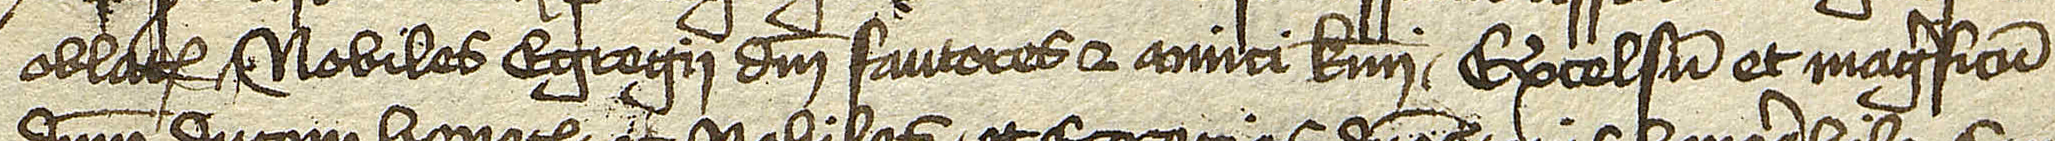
oblat*/ Nobiles Egregii d*m fautores @ amici k*mi / Excelſu* et mag*ficu*
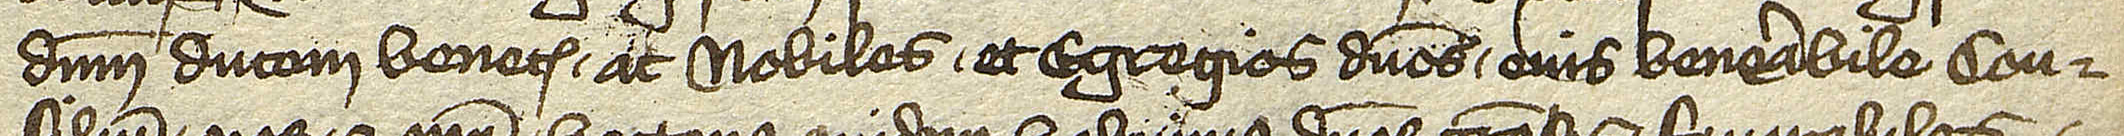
d*n*m ducem Venet* / ac Nobiles / et Egregios duc*s / eius vene*abile Con =
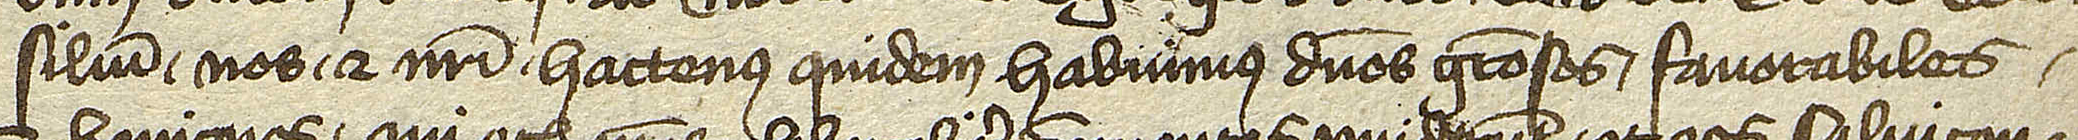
ſiliu* / nos / @ n*ri hacten* quidem habuim* duc*s g*r*oſos / fauorabiles /
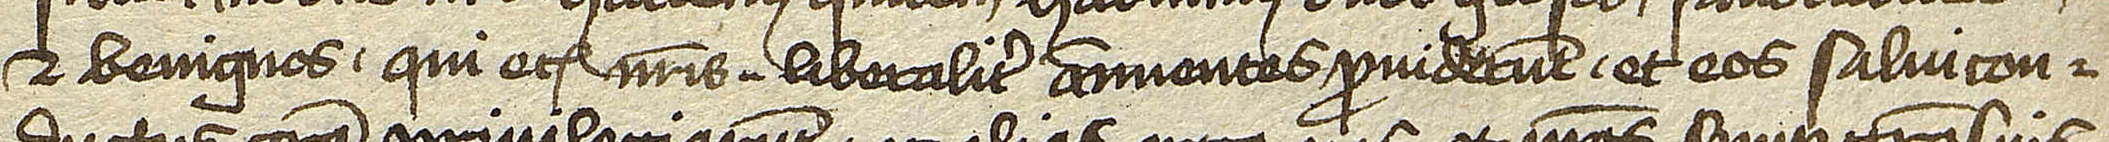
@ benignos / qui ei* n*is ~ liberalit* an*uentes p*uideru*t / et eos ſaluicon =
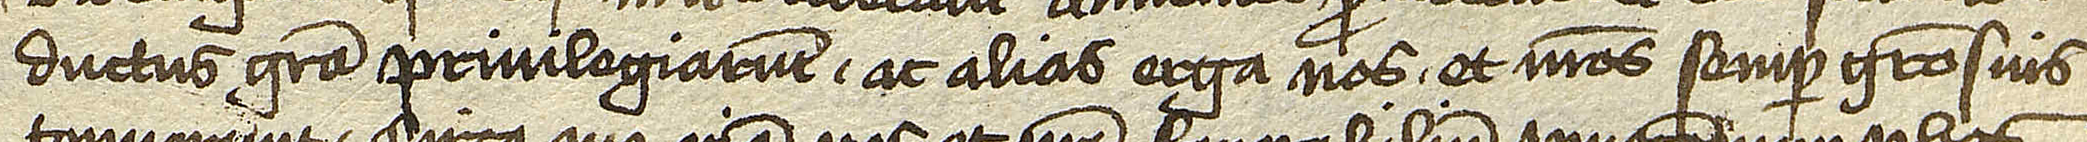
ductus gr*a* priuilegiaru*t / ac alias erga nos / et n*ros ſemp* g*r*oſius
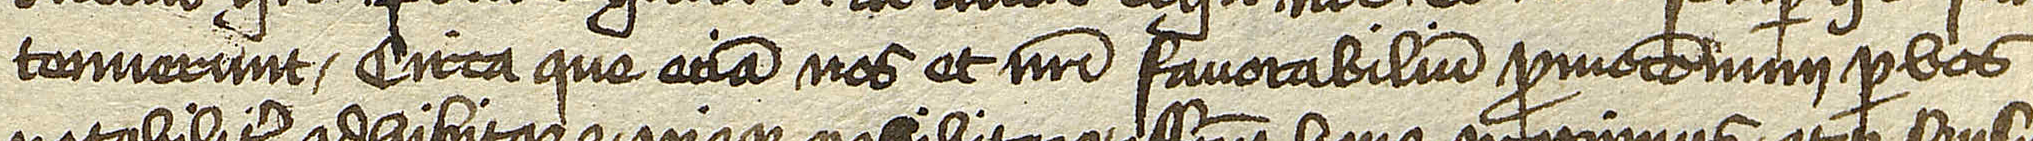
tenuerunt / Circa que etia* nos et n*ri fauorabiliu* p*mot*onum p* vos
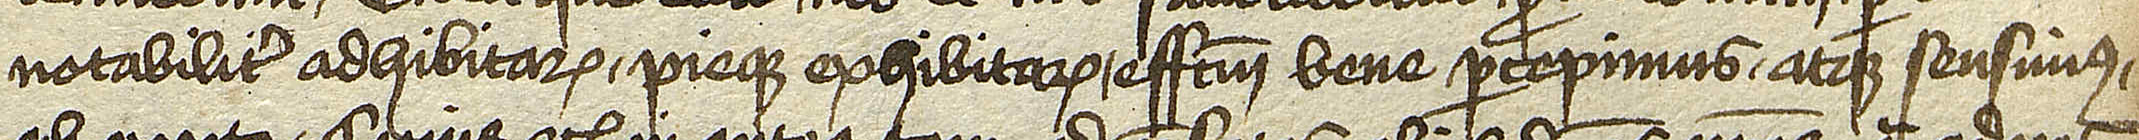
notabilit* adhibita* / pieq* exhibita* eff*c*m bene p*cepimus atq* ſenſim* /
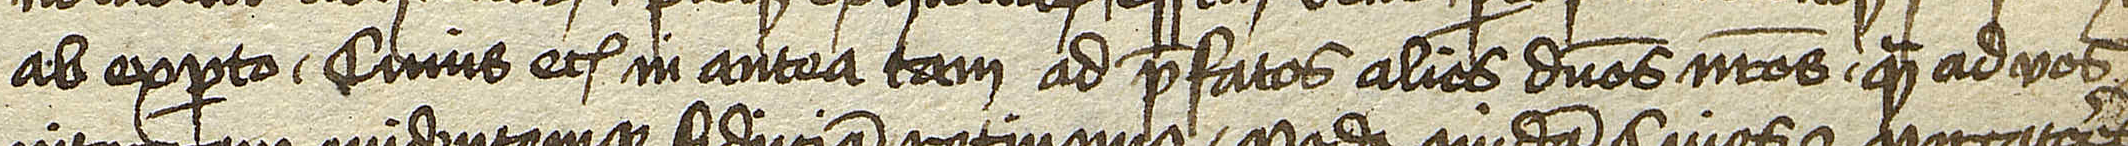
ab ex p*to / Ciuis ec* in antea tam ad p*fatos alios duc*s n*ros / q* ad vos
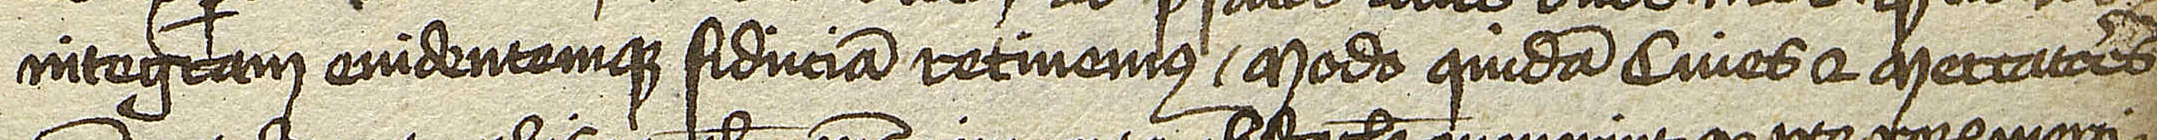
integram euidentemq* fiducia* retinem* / Modo quida* Ciues @ Mercato*es
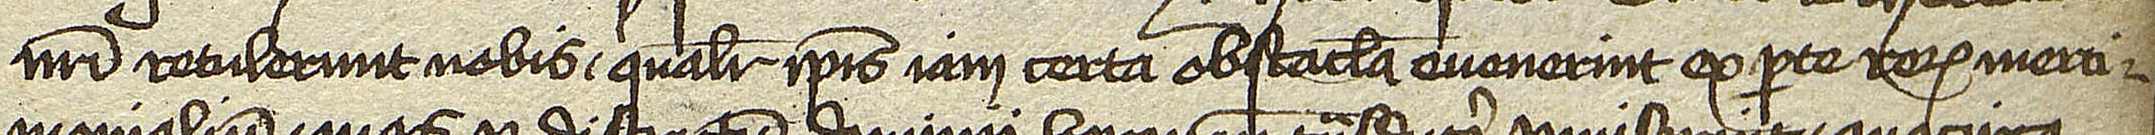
n*ri retulerunt nobis / qual*r ip*is iam certa obſtac*la euenerint ex p*te re* merci =
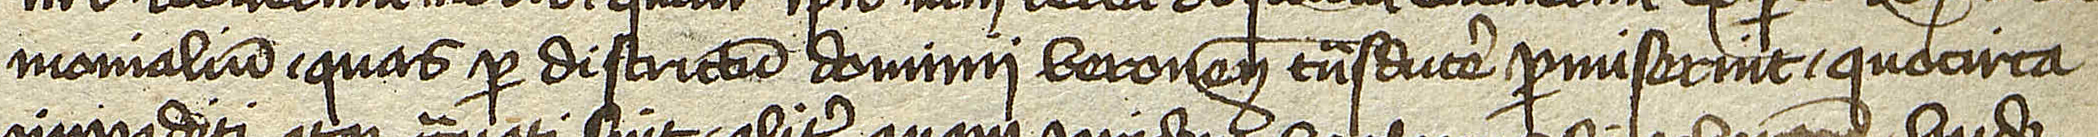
monialiu* / quas p* diſtricu* dominii veronen* t*nſduce* p*miſerint / quocirca
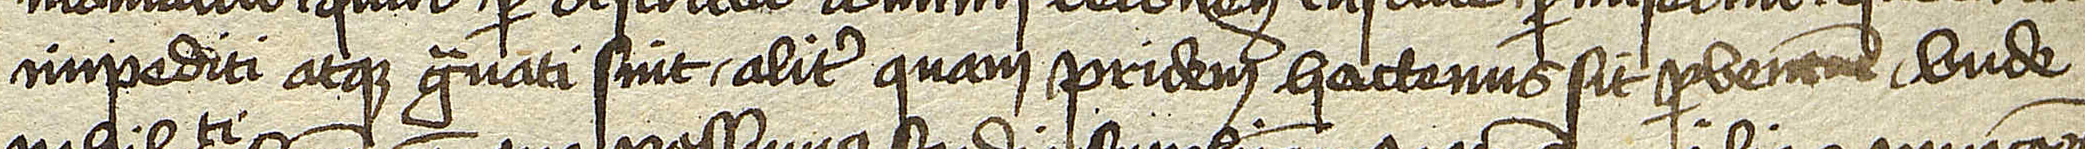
impediti atq* g*uati ſint / alit* quam pridem hactenus ſit p*venia* / vnde
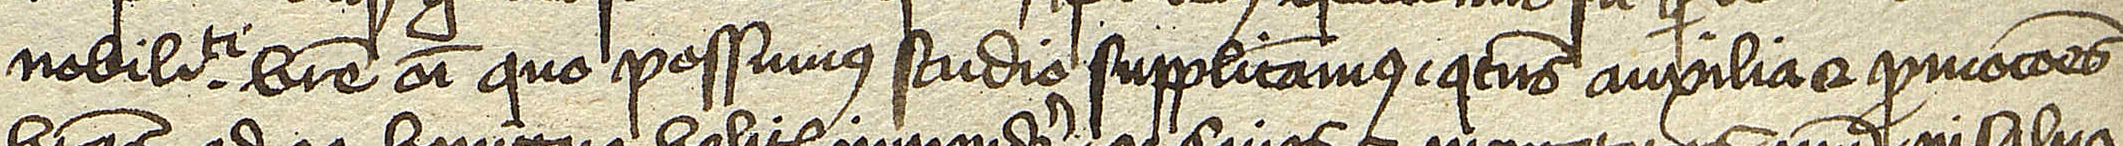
nobili*ti v*re o*i quo poſſum* ſtudio ſupplicam* / q*t*us auxilia @ p*moc*o*es
